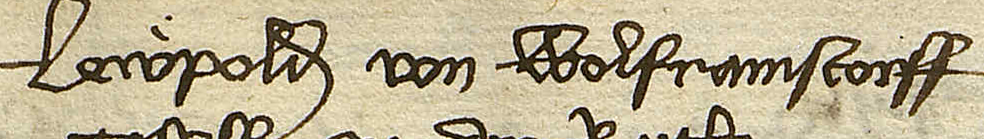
Leẅpold* von Wolframſtorff
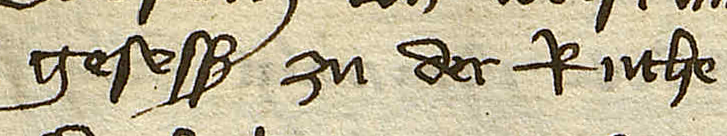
geſeſſ* ʒu der Ruthe
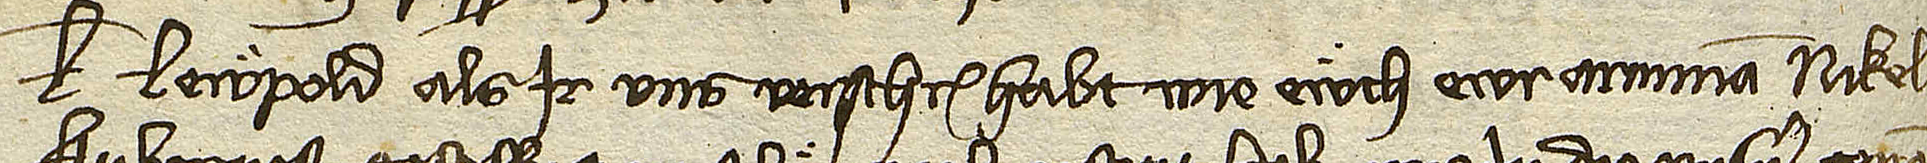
L* Leẅpold als Ir vns verſchr* habt wie eẅch ewr armma* Nikel
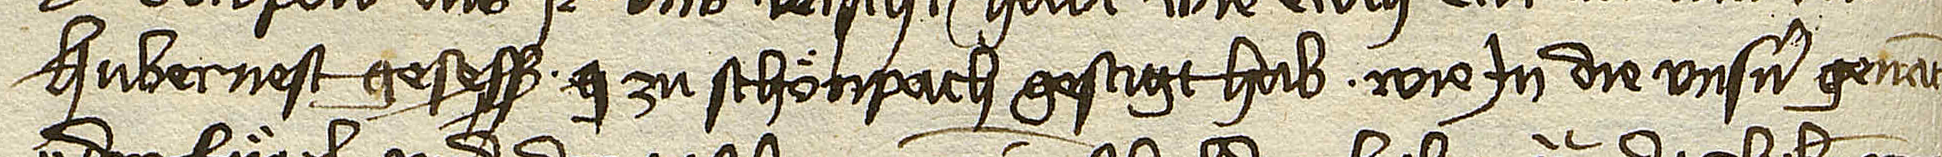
Huberneſt geſeſſ* . g ʒu ſchönpach geſagt hab* . wie In die vnſ*n gena*t
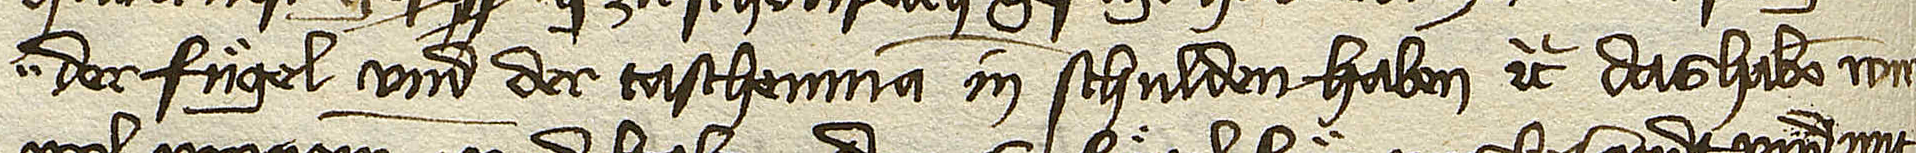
~ der fügel vnd der taſchenma* in ſchulden haben ec* das habe* wir
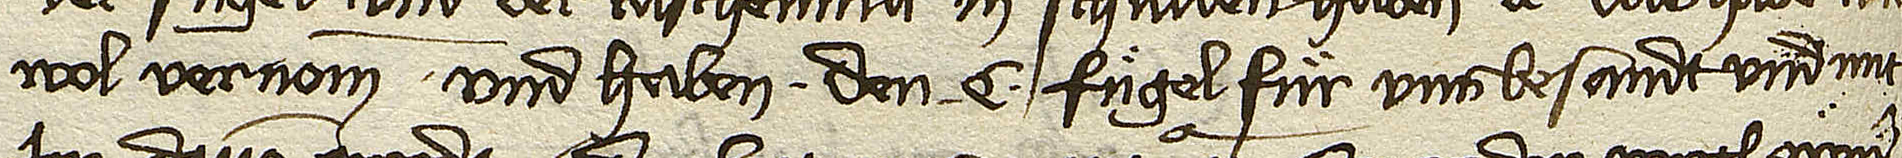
wol vernom* . vnd haben . den C . fügel für vns beſandt vnd mit
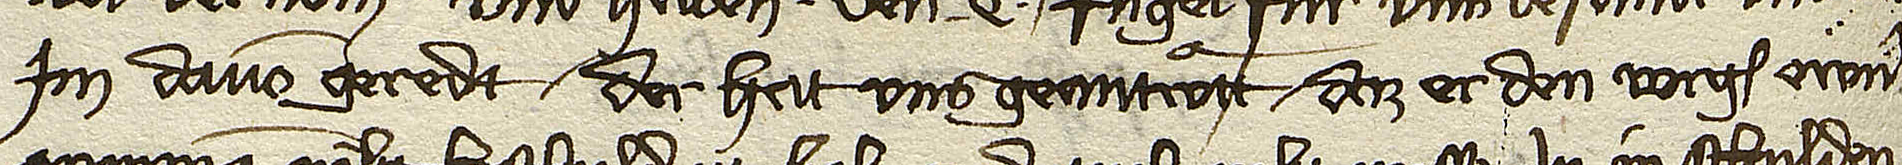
Im dauo* geredt / Der hett vns geantw*tt / daʒ er den vorg* eẅ*n
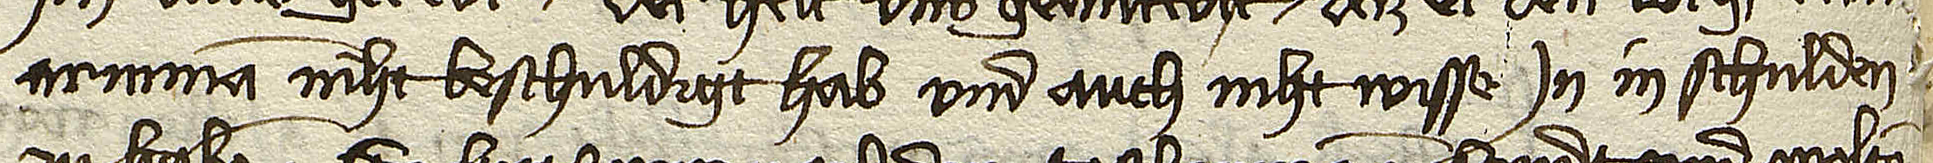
armma* niht beſchuldigt hab vnd auch niht wiſſe In in ſchulden
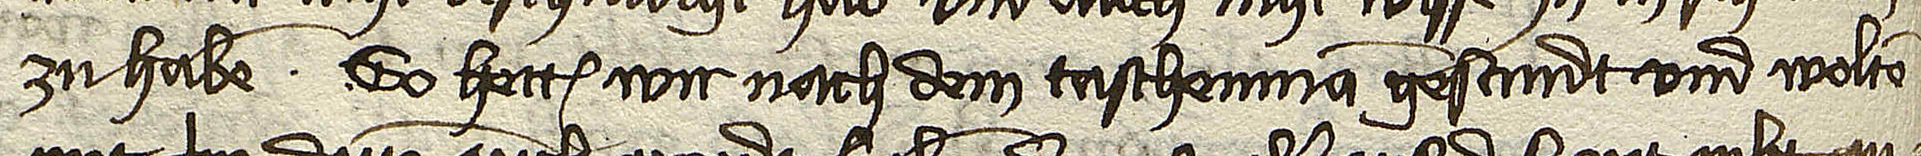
ʒu habe* . So hett* wir nach dem taſchenma* geſandt vnd wolte*
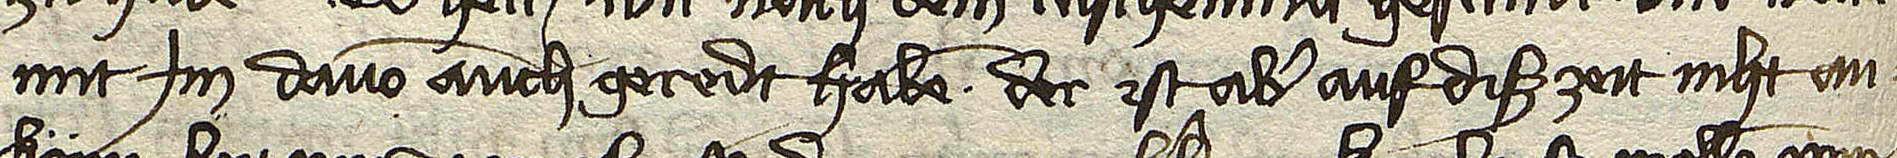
mit Im dauo* auch geredt habe* . der iſt ab* auf diſʒ ʒeit niht an =
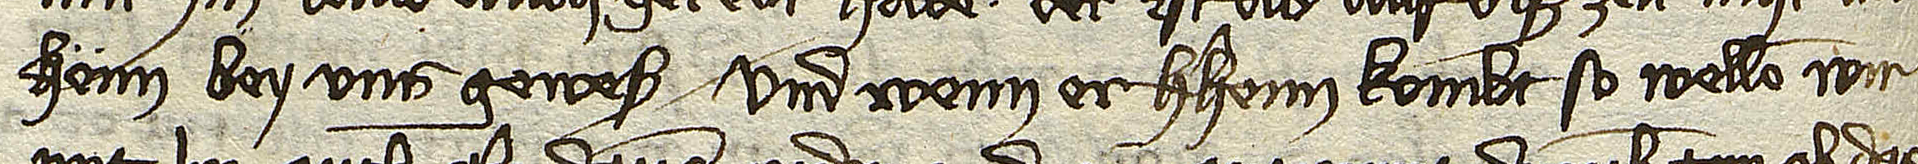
heim bey vns geweſ* / Vnd wenn er h* heim* kombt ſo welle* wir
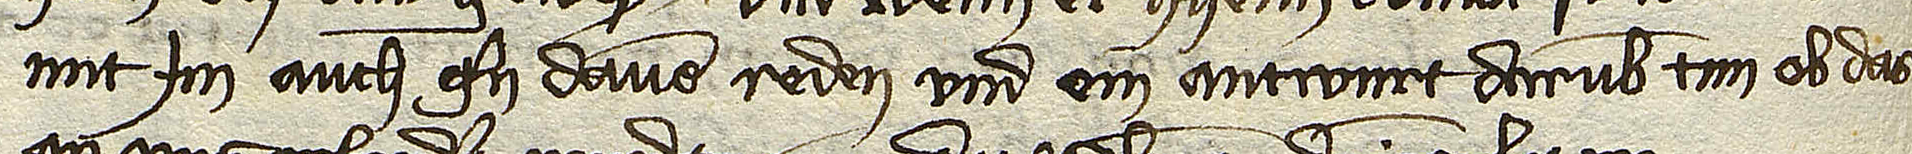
mit Im auch g*n dauo* reden vnd ein antwurt darub* tun ob das
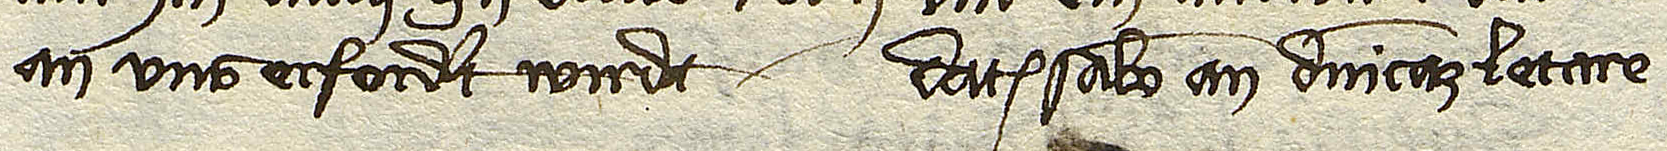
an vns erford*t wirdt / Dat* ſabo* an* dnica* letare
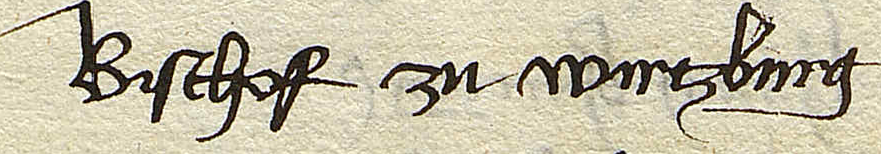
Biſchof ʒu wircʒburg
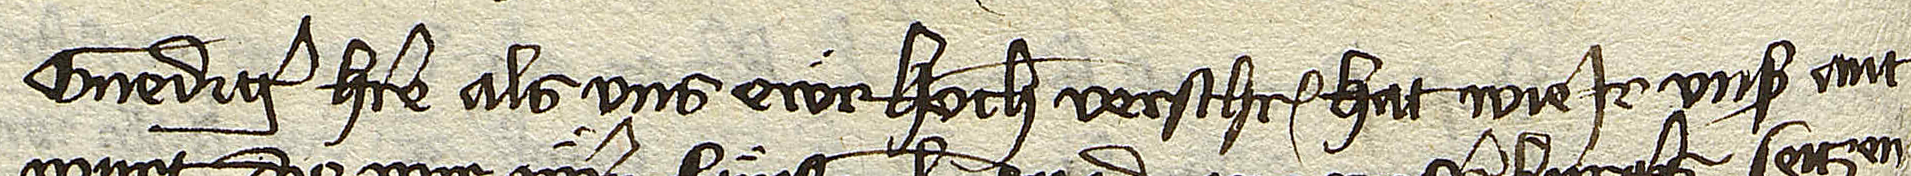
Gnedig* h*re als vns eẅr hoch* verſchr* hat wie Ir vnſ* ant
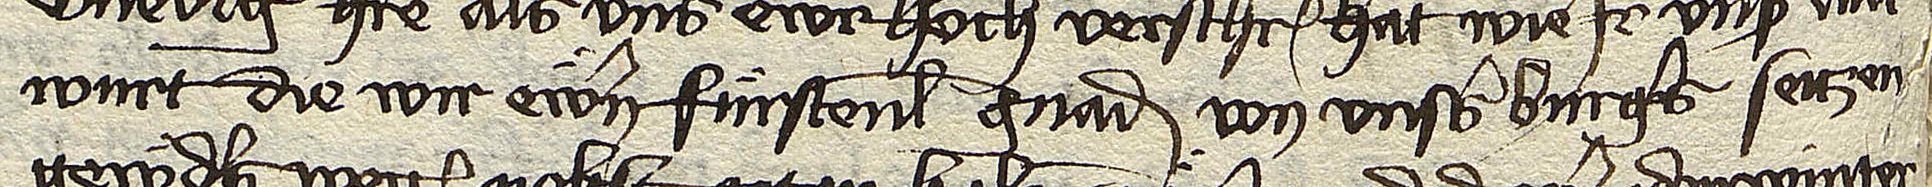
wurt die wir eẅ*n fürſtenl* gnad* von vnſ*s brug*s ſeicʒen
